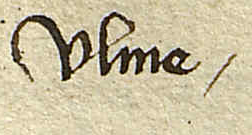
Vlme /
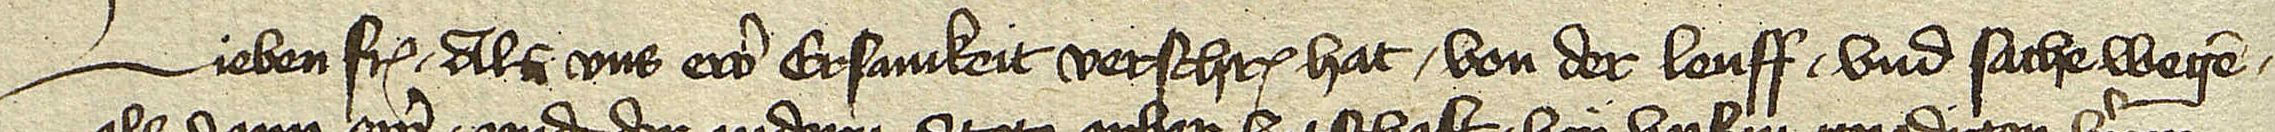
Lieben fr* / Als vns ew* Erſamkeit verſchr* hat / von der leuff / vnd ſache wege* /
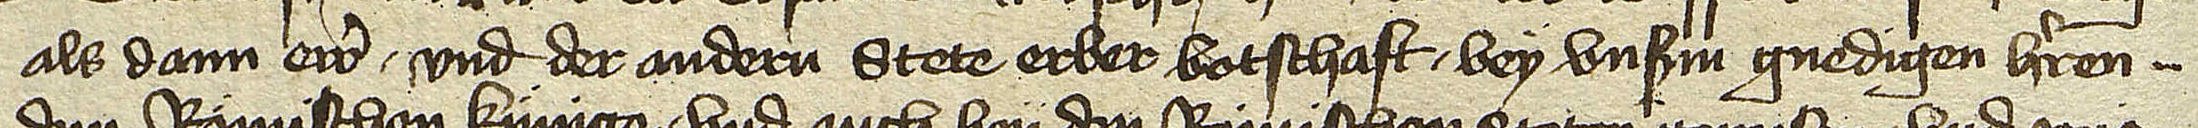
als dann ew* / vnd der andern Stete erber botſchaft / bey vnſ*m gnedigen h*ren ~
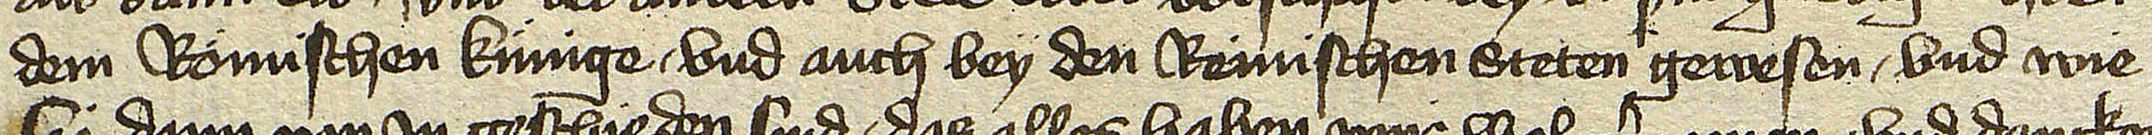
dem Römiſchen Künige / vnd auch bey den Reiniſchen Steten geweſen / vnd wie
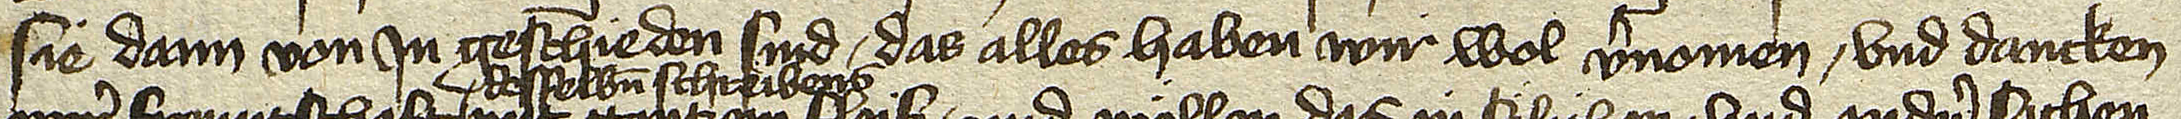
ſie dann von In geſchieden ſind / das alles haben wir wol v*nomen / vnd dancken
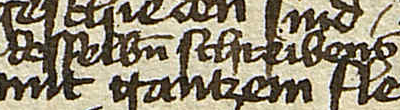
deſſelbn* ſchreibens
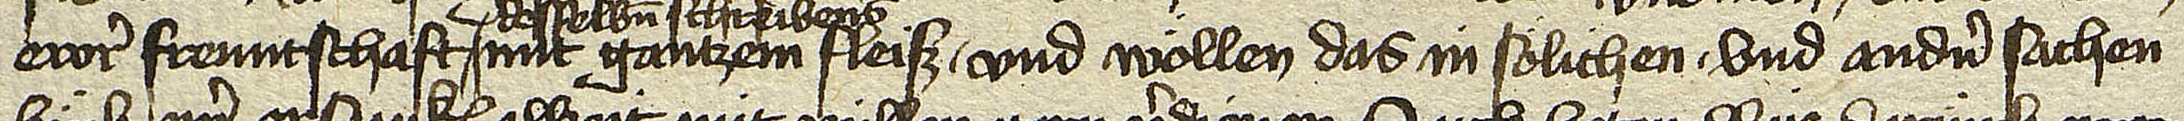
ewr* freuntſchaft mit gantʒem fleiſʒ / vnd wöllen das in ſölichen / vnd andn* ſachen
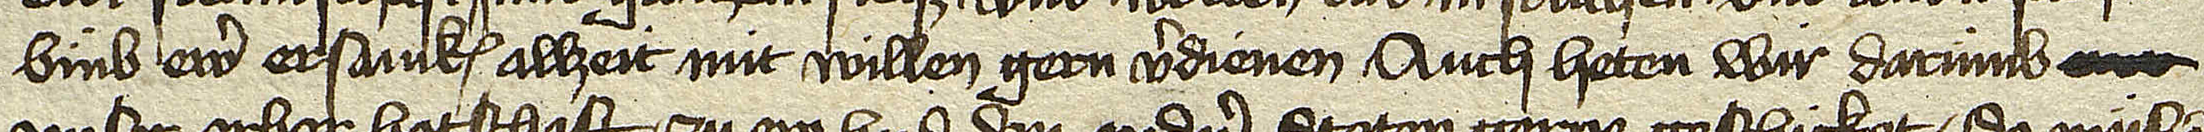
v̈mb ew* erſamk* allʒeit mit willen gern v*dienen / Auch heten wir darümb ewr
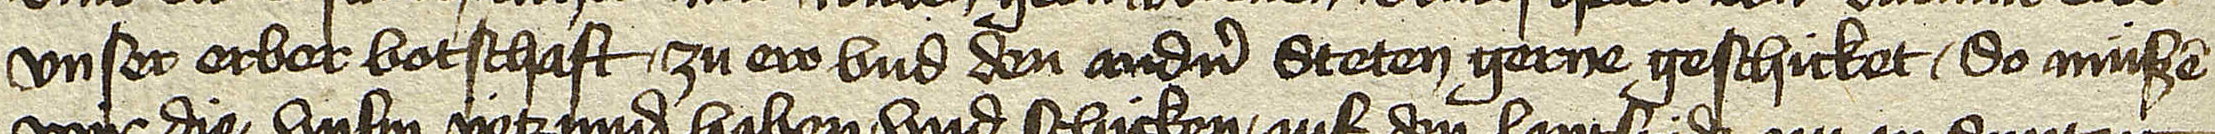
vnſer erber botſchaft / cʒu ew vnd den andn* Steten gerne geſchicket / So müſʒe*
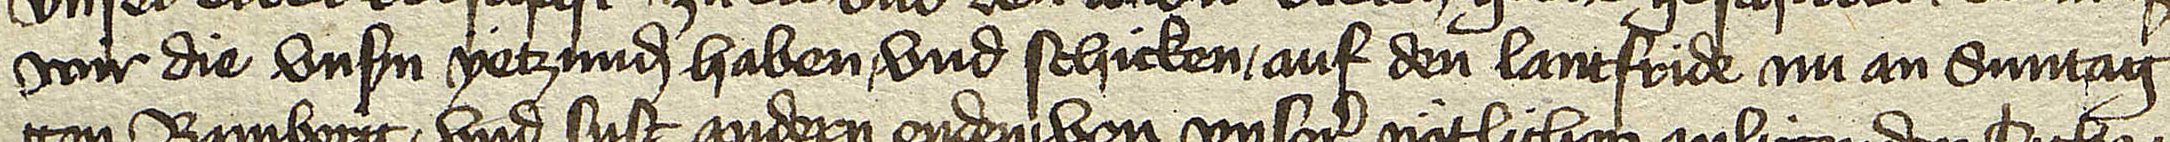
wir die vnſ*n yetʒund* haben / vnd ſchicken / auf den lantfride nu an Suntag
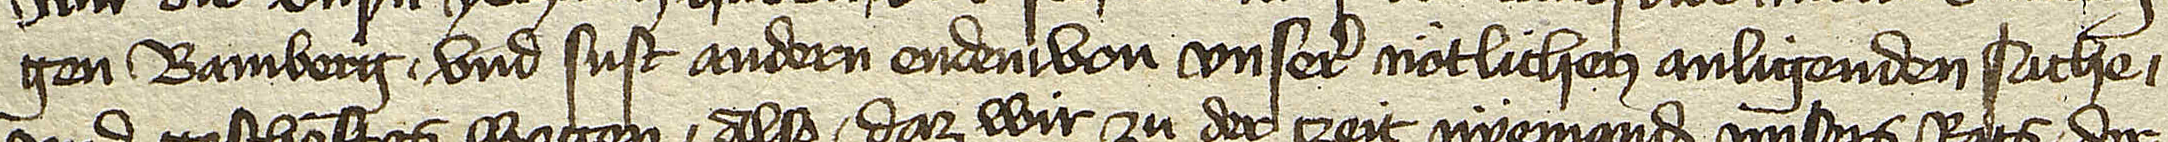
gen Bamberg / vnd ſuſt andern enden / von vnſer* nötlichen anligenden ſache /
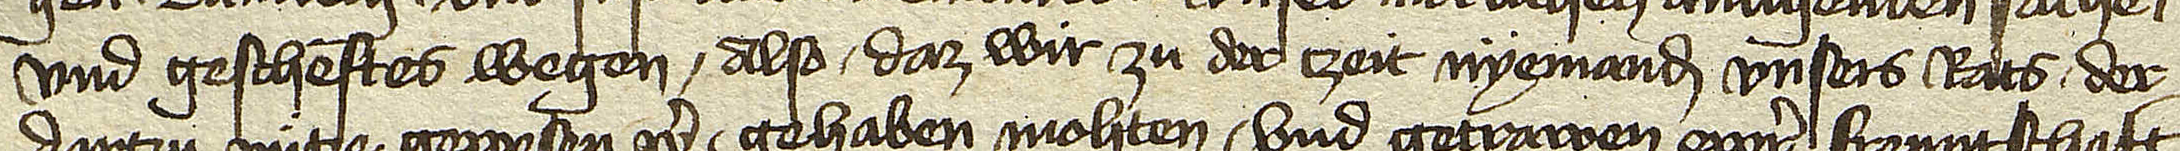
vnd geſcheftes wegen / Alſo / daʒ wir cʒu der cʒeit nyemand* vnſers Rats / der
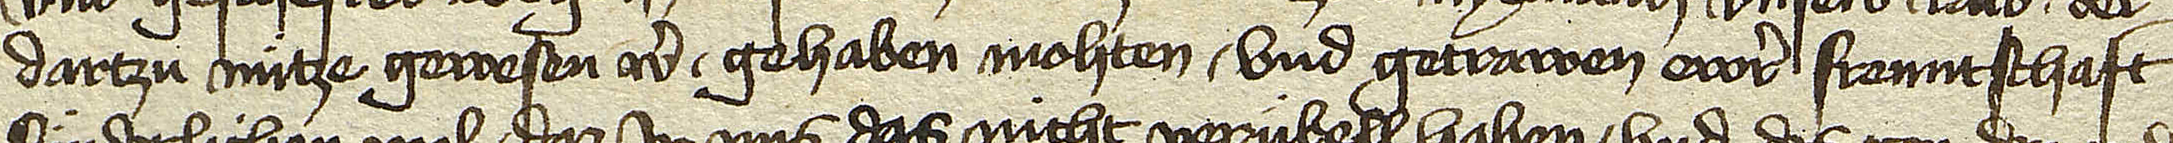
dartʒu nütʒe geweſen w* / gehaben mohten / vnd getrawen ewr* freuntſchaft
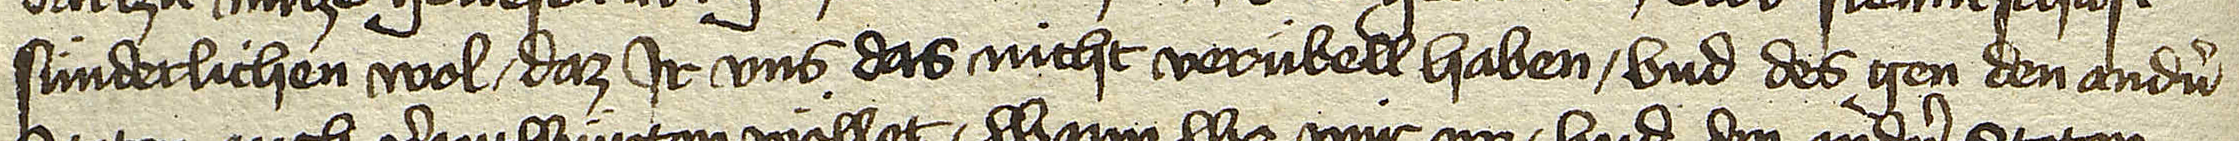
ſünderlichen wol / daʒ Ir vns das nicht verübell haben / vnd des gen den andn*
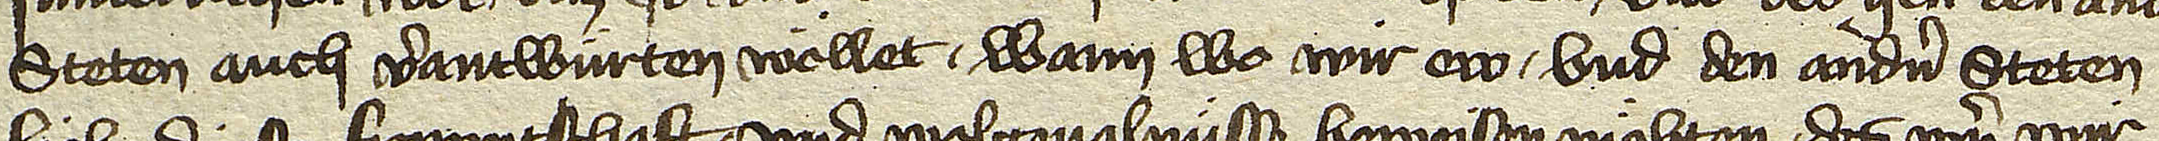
Steten auch v*antwürten wöllet / wann wo wir ew / vnd den andn* Steten
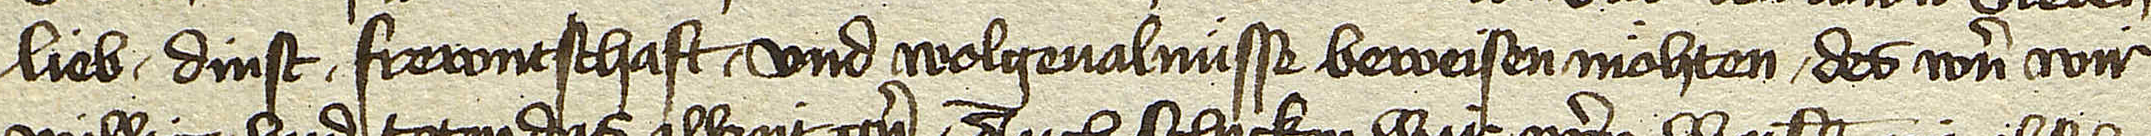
lieb / dinſt / frewntſchaft / vnd wolgeualnüſſe beweiſen möhten / des w*n wir
